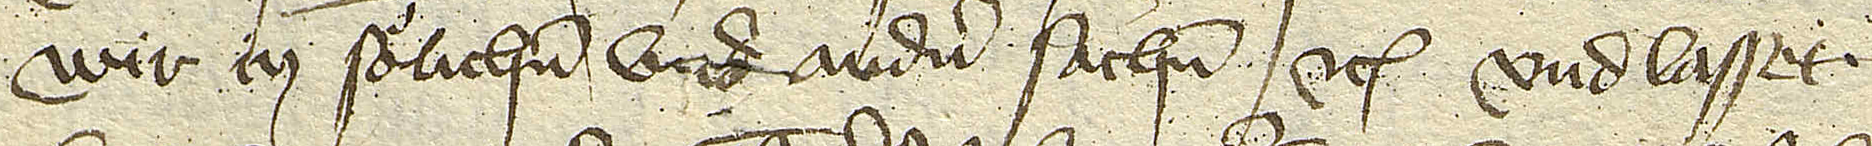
wir in ſölichn* vnd andn* ſachn* ec* vnd laſſet
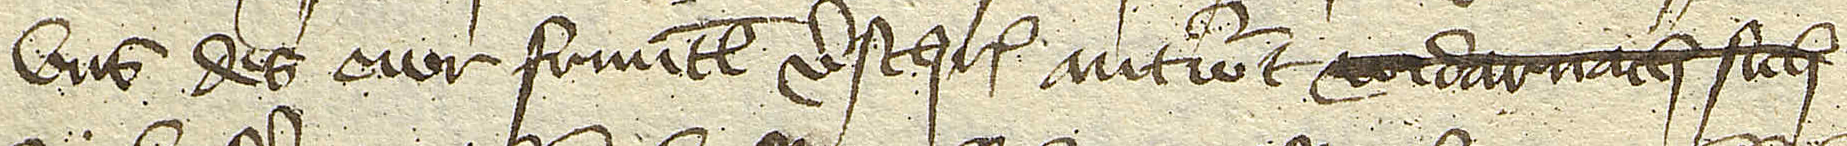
vns des ewr fruntl* v*ſchr* antwt* widarnach ſich
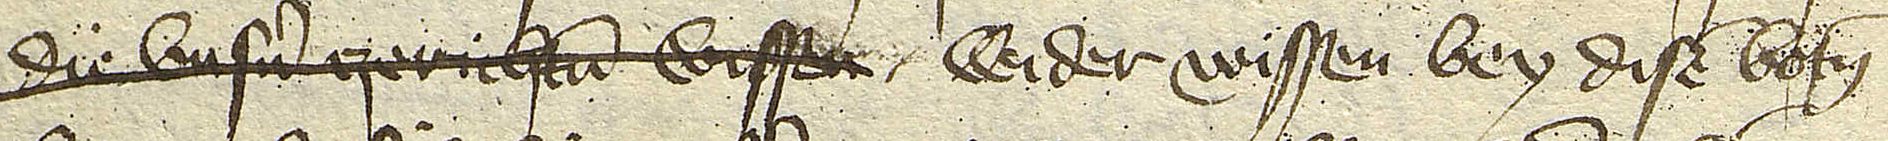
die vnſn* cʒerichtn* wiſſen / wider wiſſen bey diſe* botn*
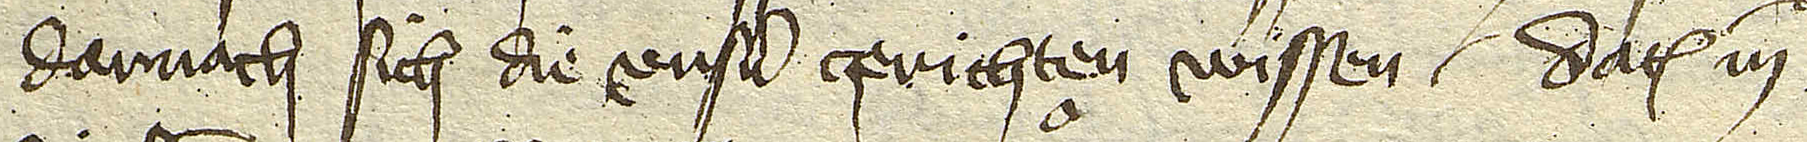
darnach ſich die vnſn* cʒerichten wiſſen / Dat* in*
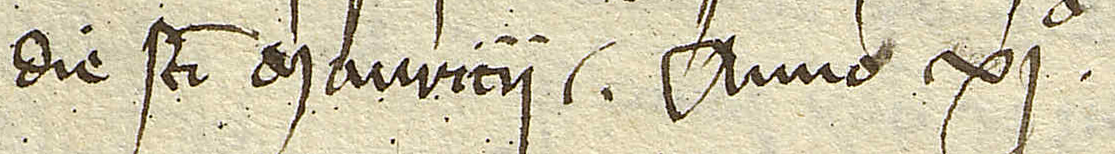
die ſci* Mauricii / . Anno xi*.
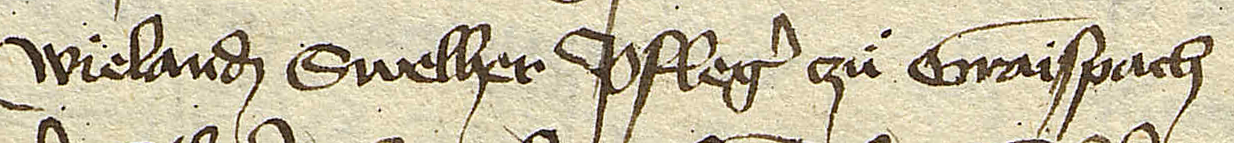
wieland* Swelher Pfleg* cʒü Graiſpach
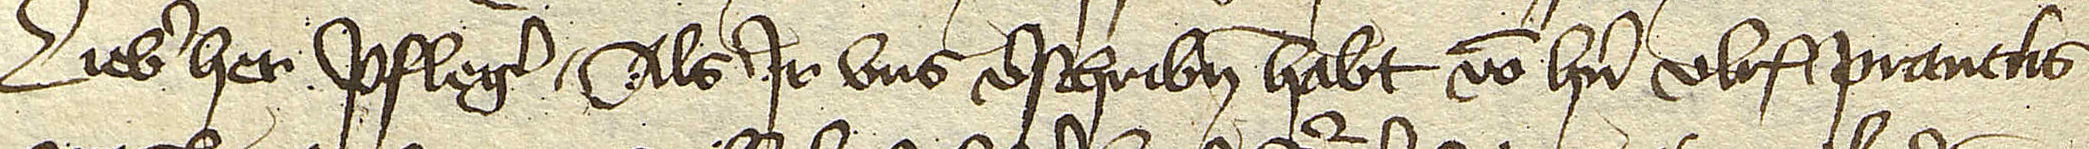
Lieb* her Pfleg* / Als Ir vns v*ſchribn* habt vo* hn* vlr* Prantns*
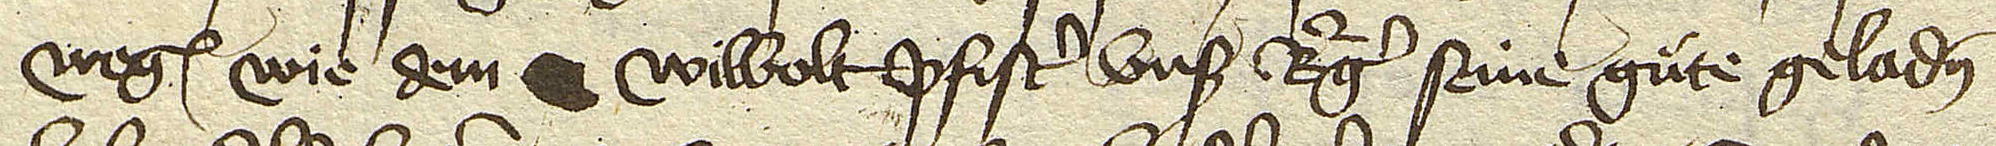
weg* wie dem wilbolt pfiſt* vnſ* B*g* ſeine güte geladn*
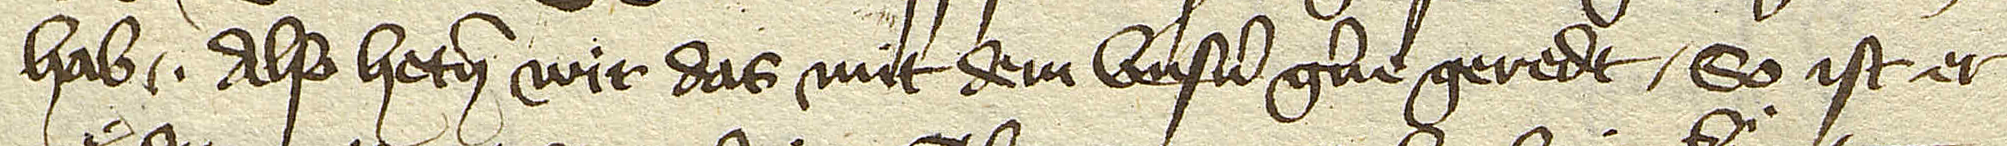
hab / . Alſo hetn* wir das mit dem vnſn* g*ne geredt / So iſt er
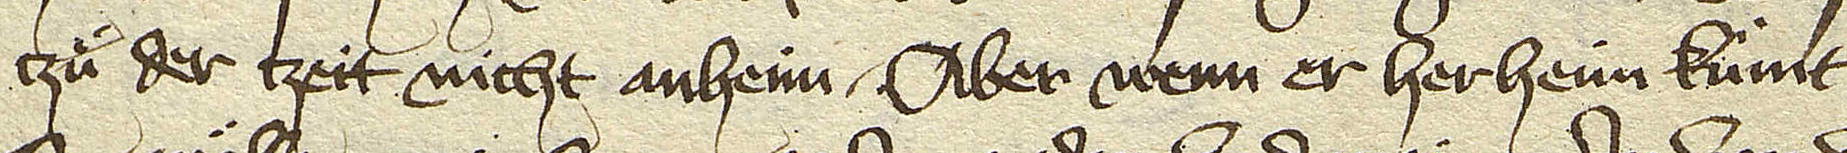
cʒü der cʒeit nicht anheim / . Aber wenn er herheim kümt
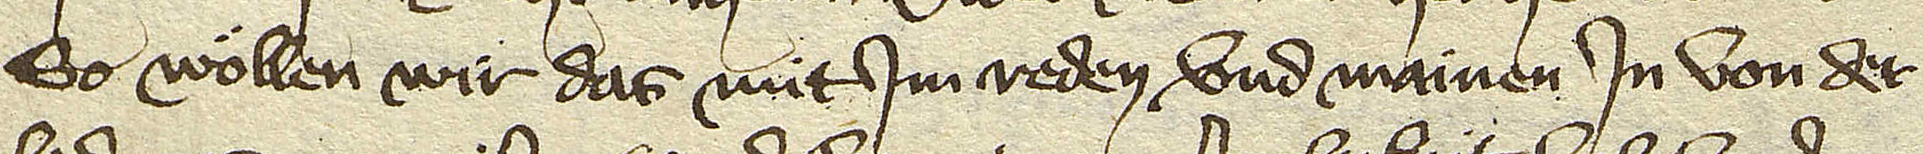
So wöllen wir das mit Im reden / vnd mainen In von der
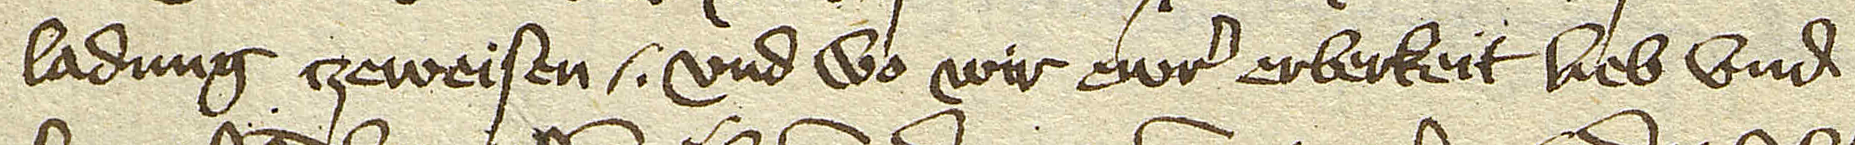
ladung cʒeweiſen / . vnd wo wir ewr* erberkeit lieb vnd
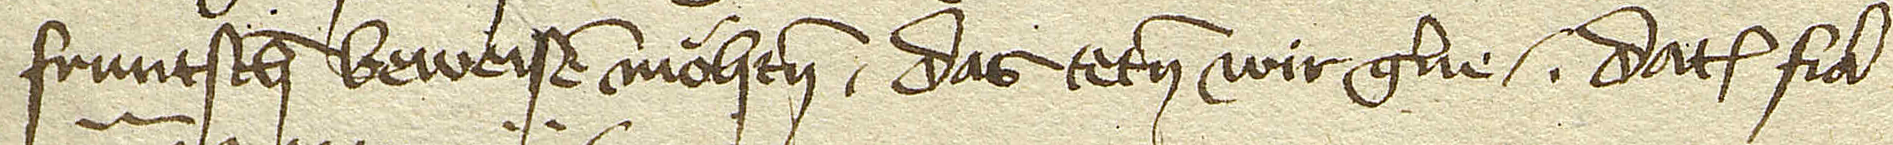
fruntſch* beweiſe* möhtn* / Das tetn* wir g*ne / . Dat* fia*
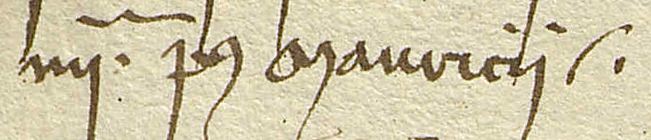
iiii* p* Mauricii / .
